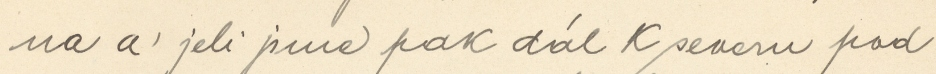na a jeli jsme pak dál k severu pod
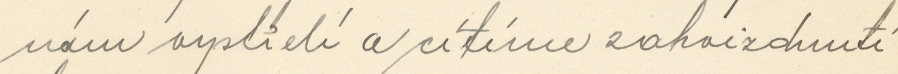nám vystřelí a cítíme zahvizdnutí
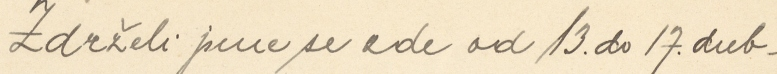Zdrželi jsme se zde od 13. do 17. dub-
